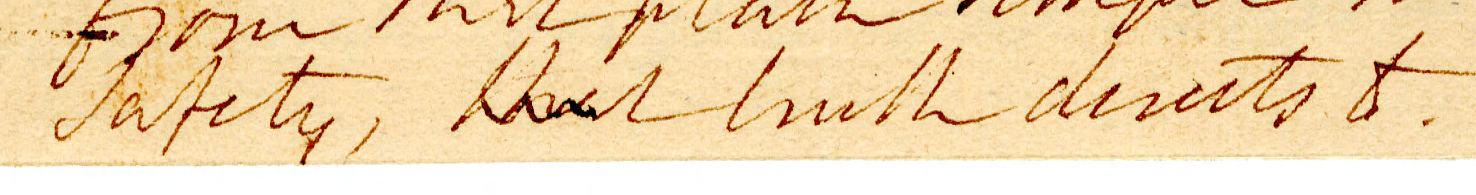safety, that truth directs to.
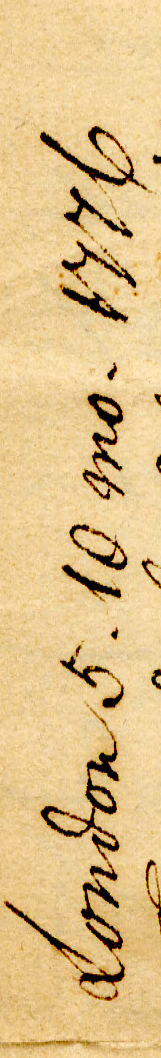London 5. 10 mo. 1776
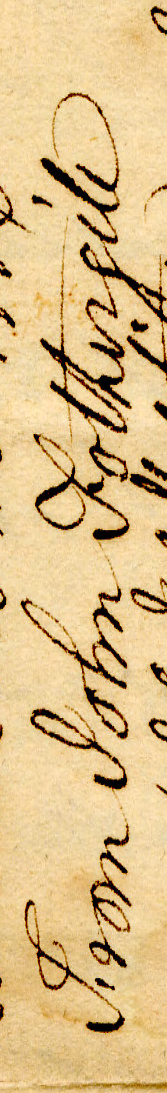From John Fothergill
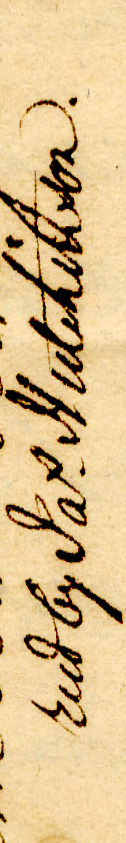recd by Ja^s. Hutchinson.
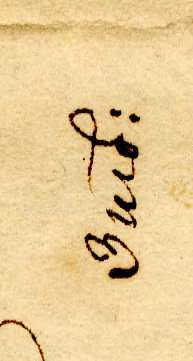3rd:
